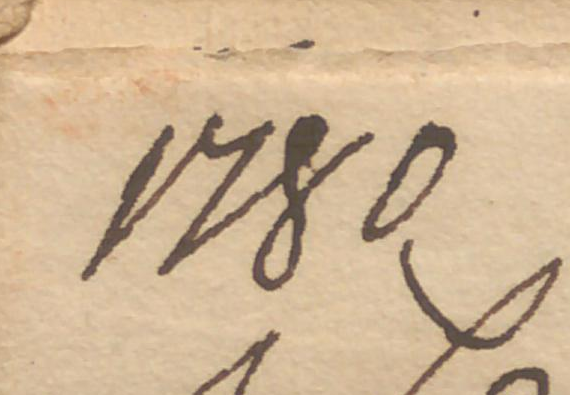1780
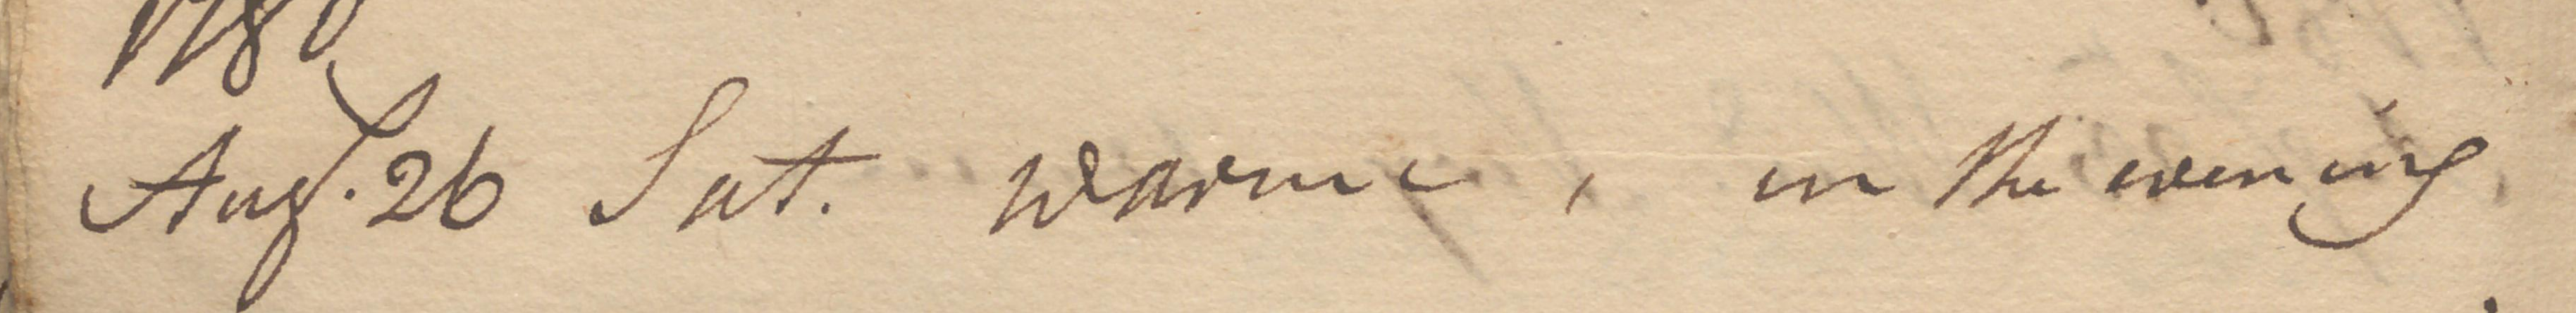Aug^t. 26 Sat. warme, in the evening
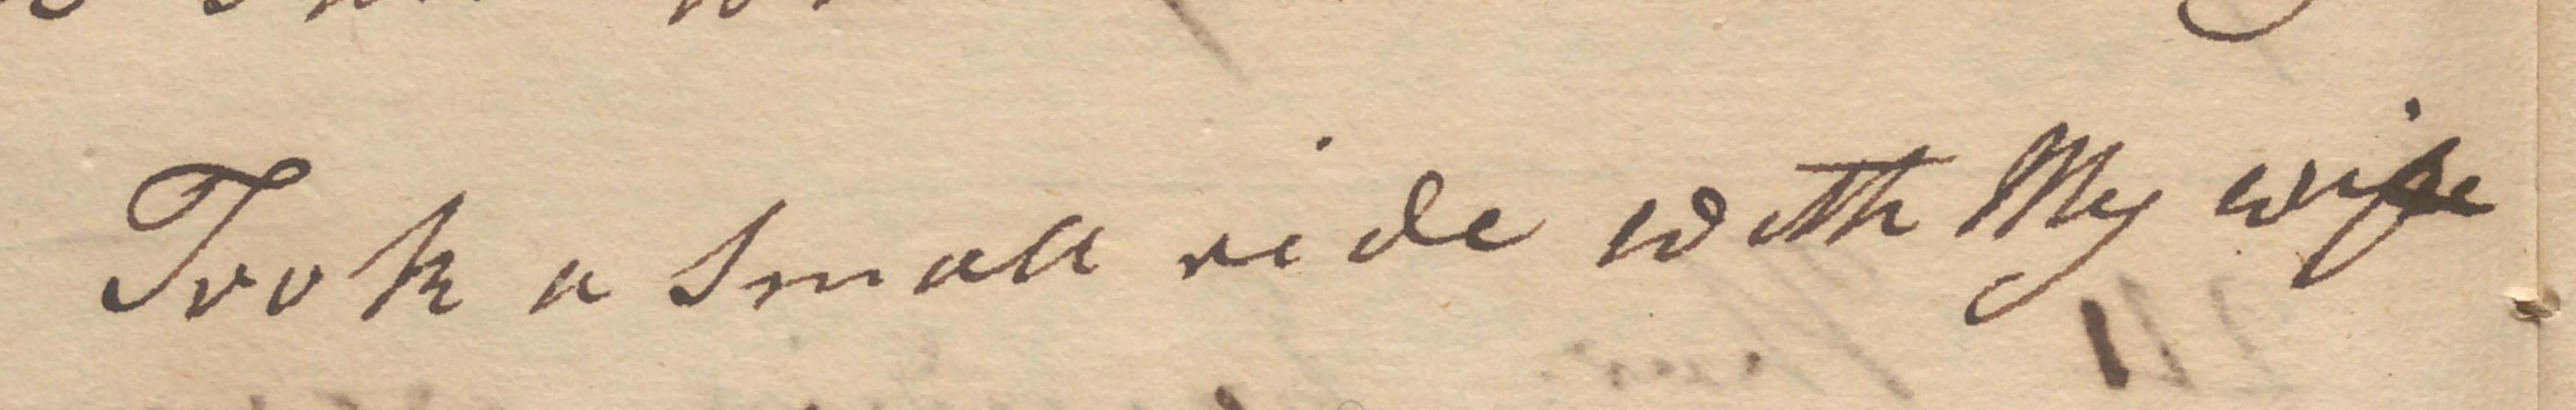Took a small ride with My wife
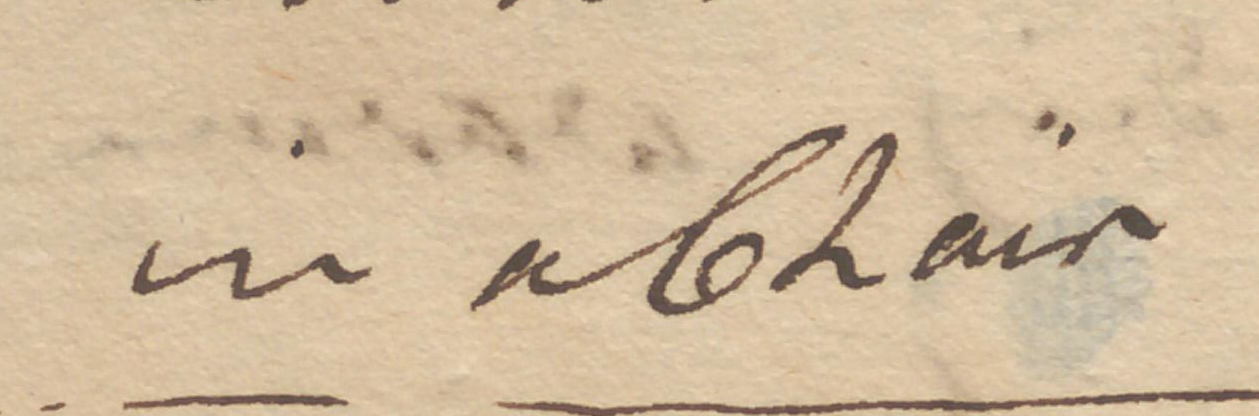in a Chair
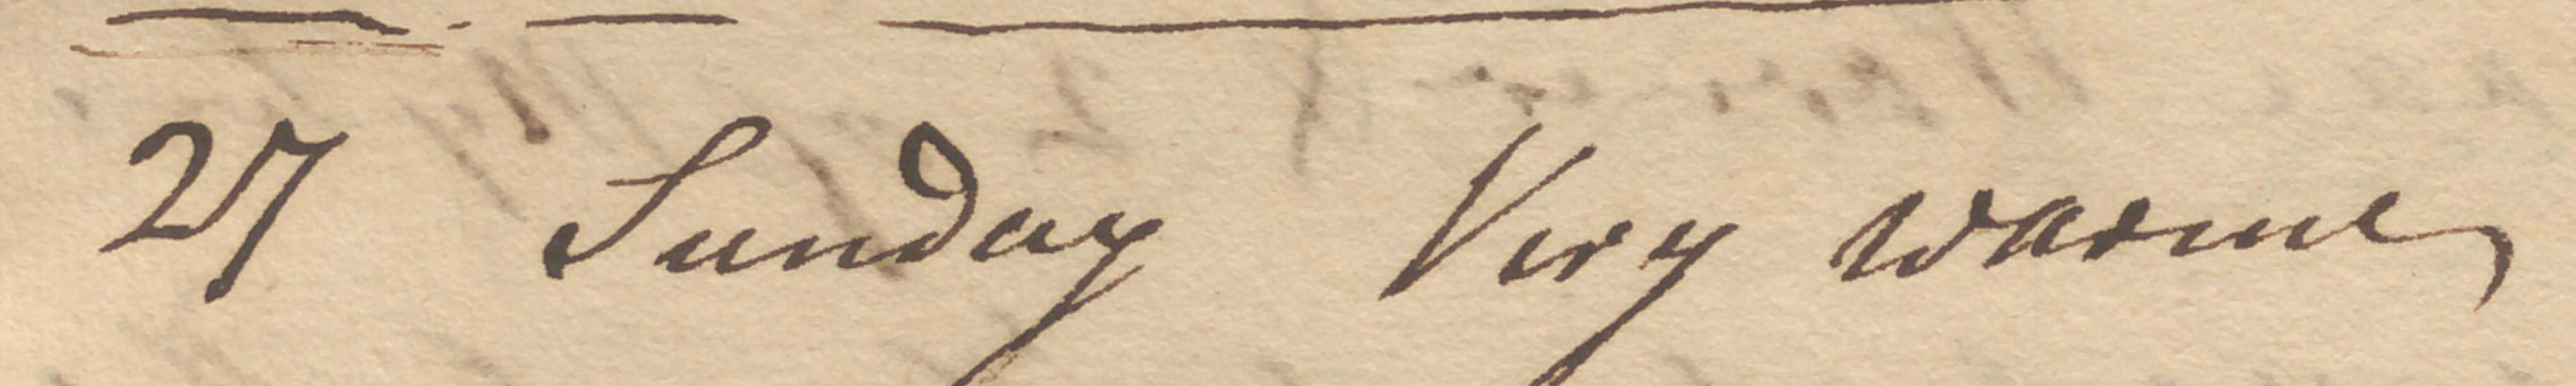27 Sunday, Very warme
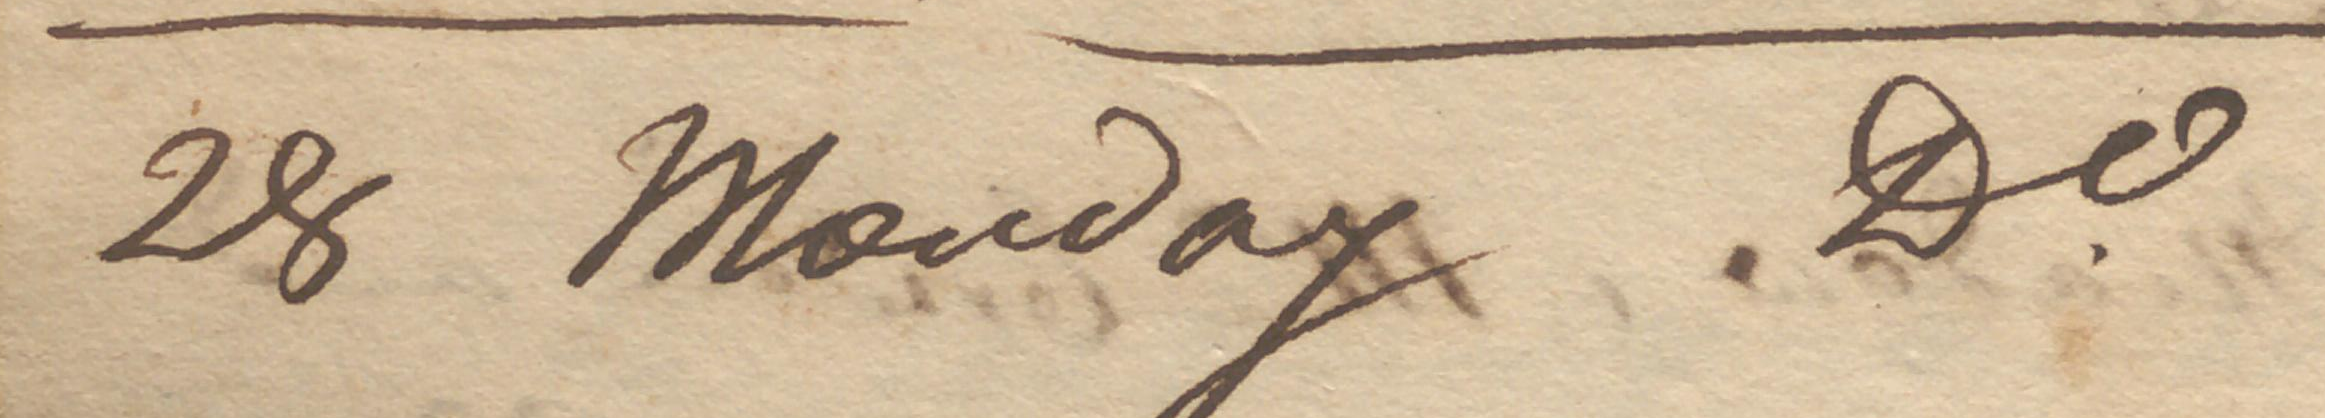28 Monday
